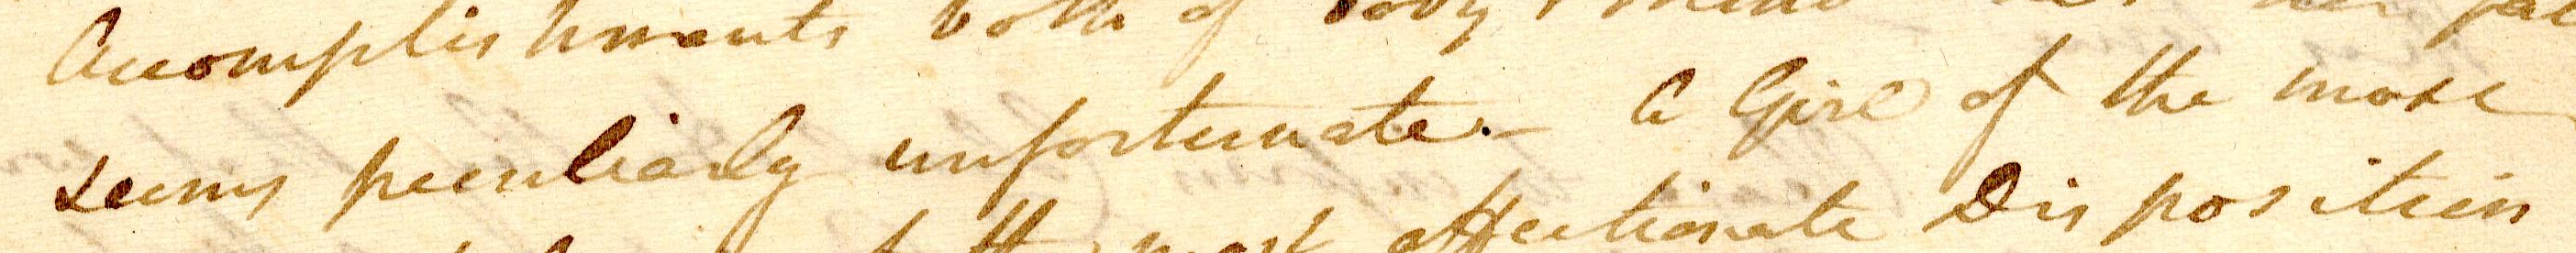seems peculiarly unfortunate. A Girl of the most
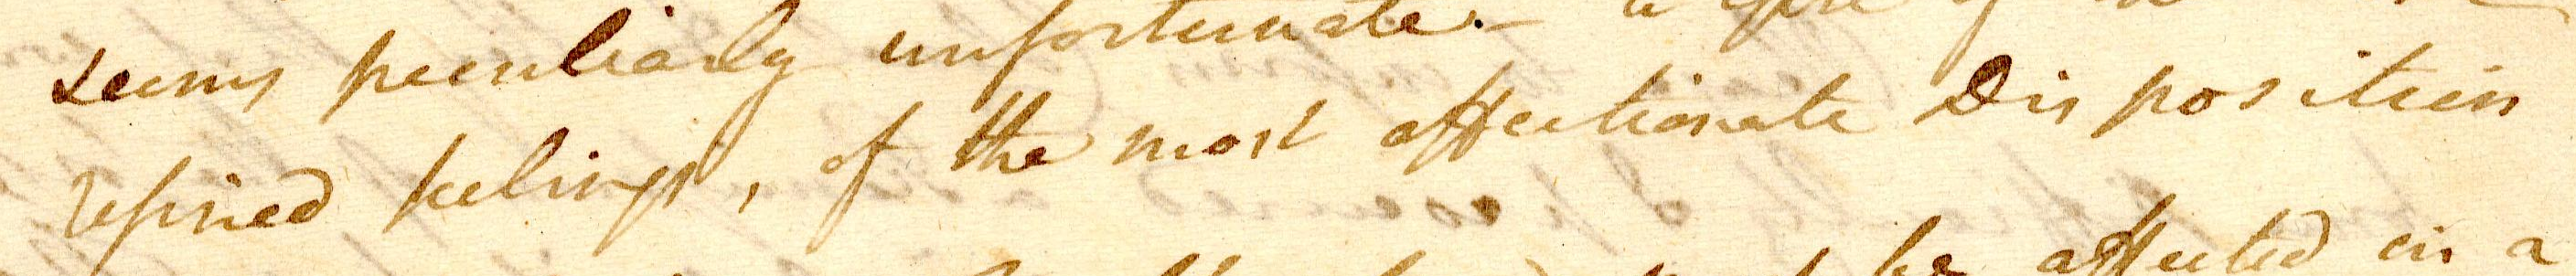refined feelings, of the most affectionate Disposition
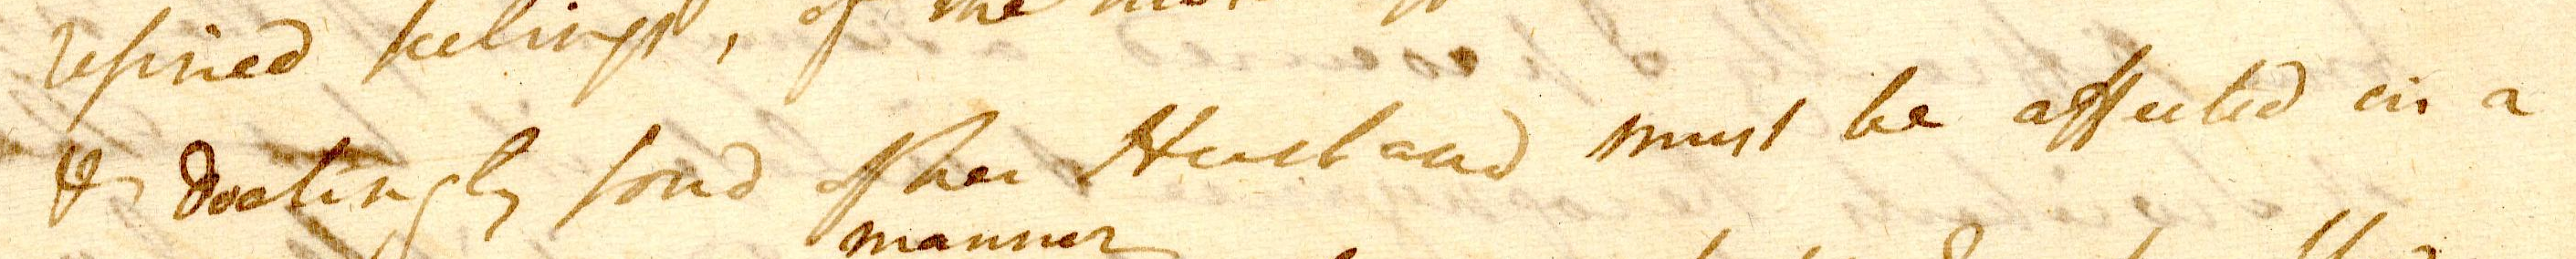& doatingly fond of her Husband must be affected in a
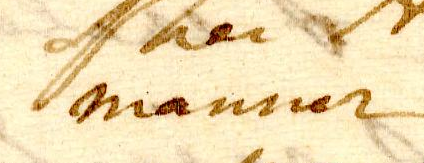manner
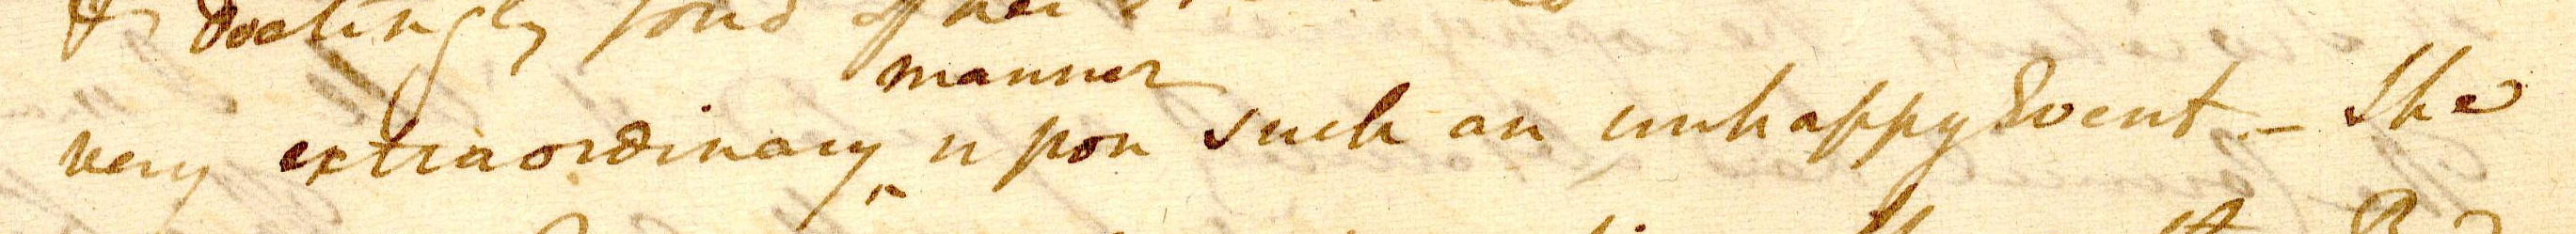very extraordinary ^ upon such an unhappy Event. She
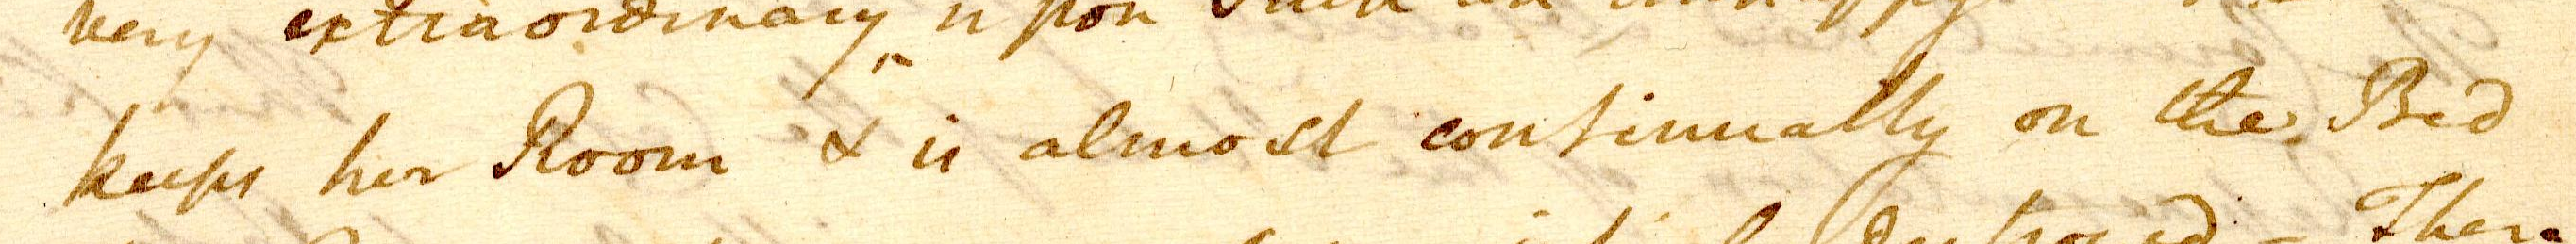keeps her Room & is almost continually on the Bed
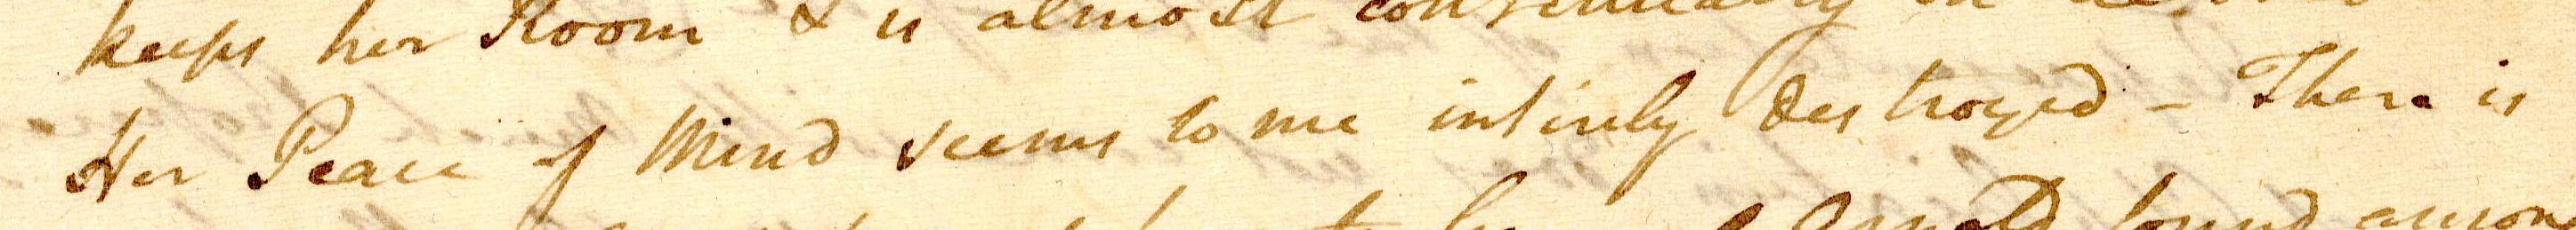Her Peace of Mind seems to me intirely destroyed. There is
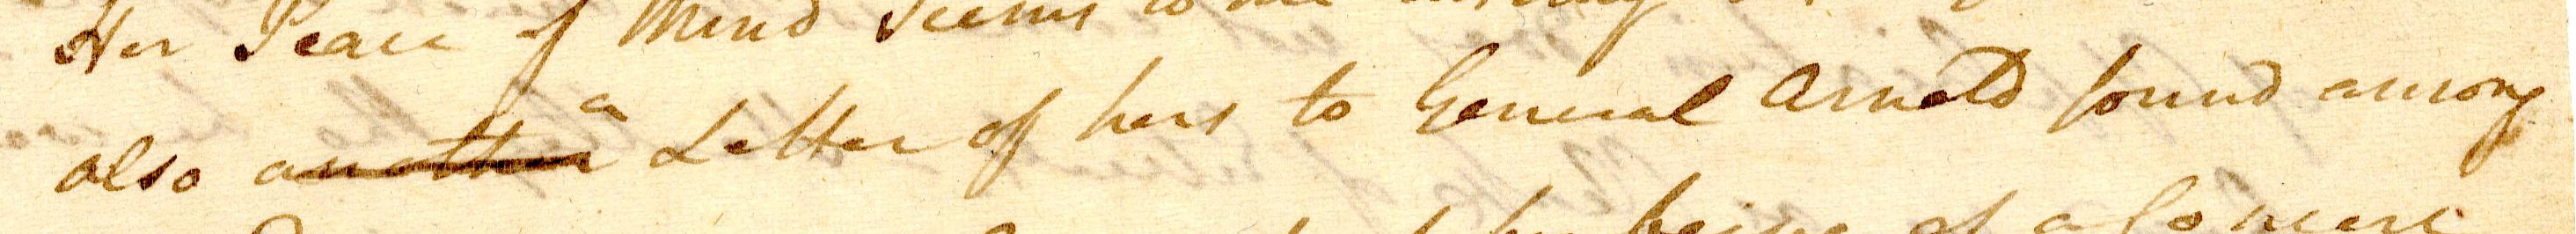also another ^ Letter of hers to General Arnold found among
